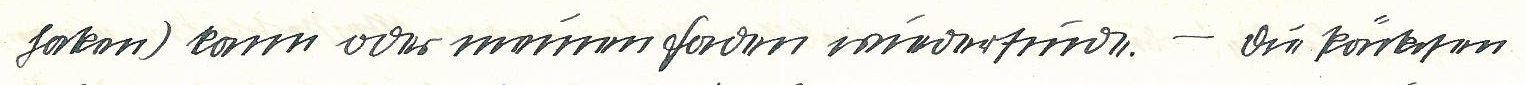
haken) kann oder meinen Faden wiederfinde. – Die Päckchen
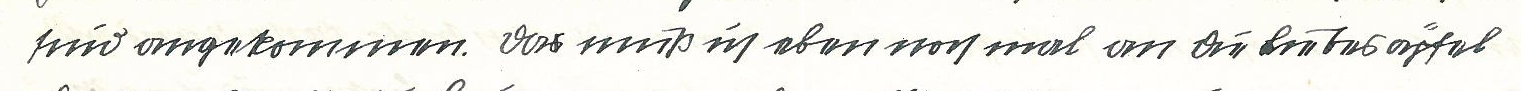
sind angekommen. Das muß ich eben noch mal an die Liebesäpfel
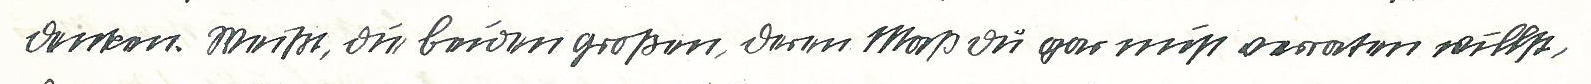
denken. Weißt, die beiden großen, deren Maß Du gar nicht verraten willst,
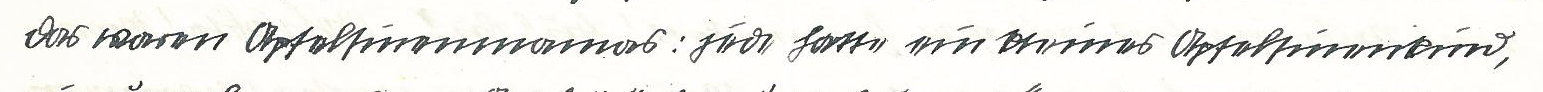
das waren Apfelsinenmamas: jede hatte ein kleines Apfelsinenkind,
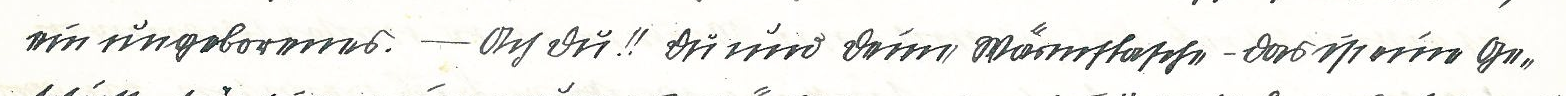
ein ungeborenes. – Ach, Du!! Du und Deine Wärmflasche – das ist eine Ge¬
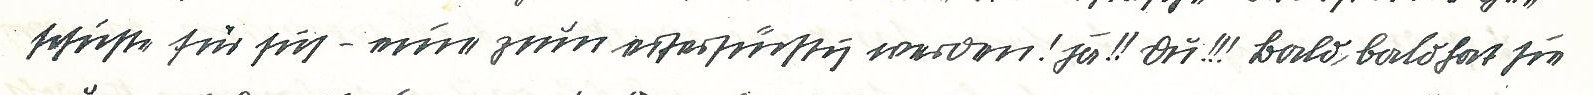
schichte für sich – eine zum eifersüchtig werden! ja!! Du!!! Bald, bald hat sie
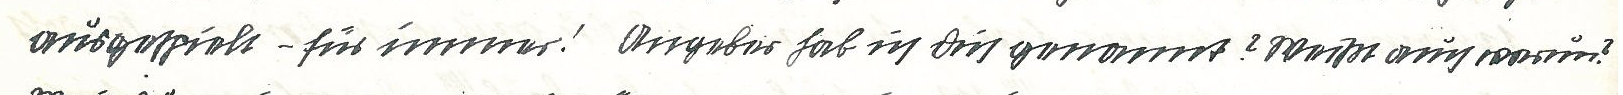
ausgespielt – für immer! Angeber hab ich Dich genannt? Weißt auch warum?
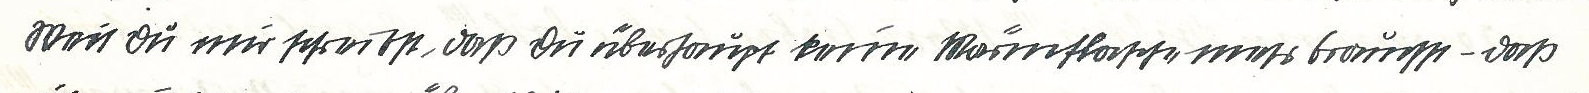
Weil Du mir schreibst, daß Du überhaupt keine Wärmflasche mehr brauchst – daß
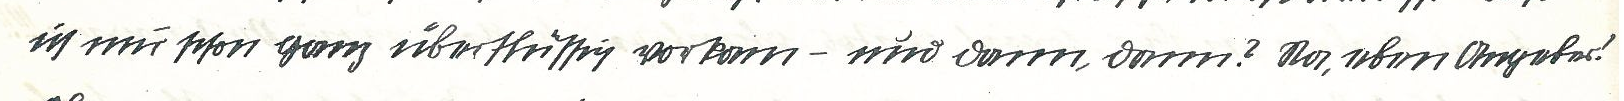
ich mir schon überflüssig vorkam – und dann, dann? Na, eben Angeber!
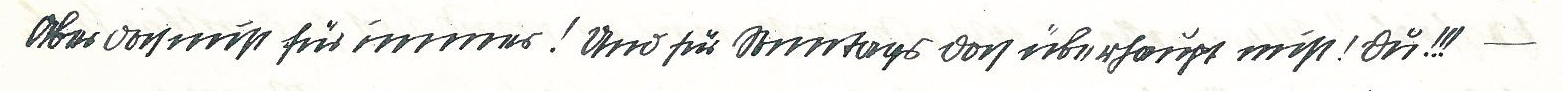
Aber doch nicht für immer! Und für Sonntags doch überhaupt nicht! Du!!! –
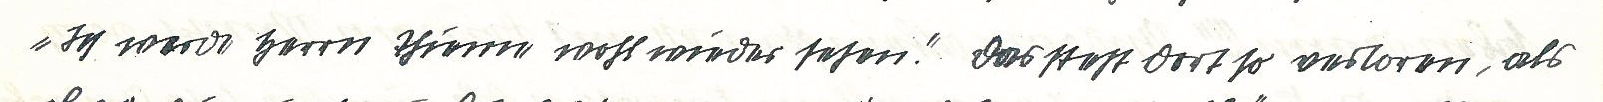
„Ich werde Herrn T. wohl wieder sehen.” Das steht dort so verloren, als
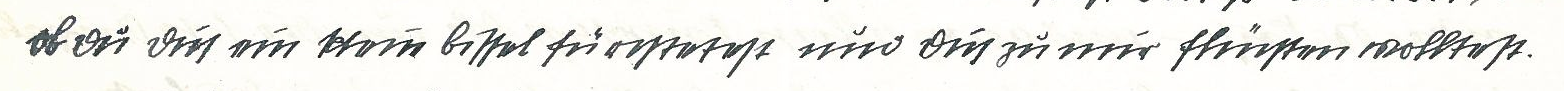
ob Du Dich ein klein bissel fürchtetest und Dich zu mir flüchten wolltest.
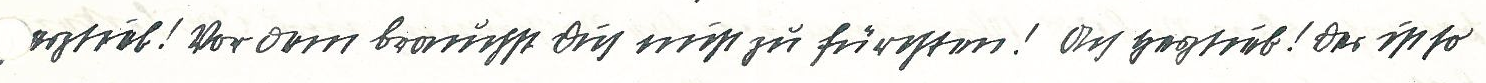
erzlieb! Vor dem brauchst Dich nicht zu fürchten! Ach Herzlieb! Der ist so
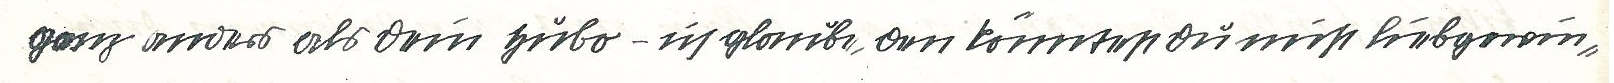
ganz anders als Dein Hubo – ich glaube, den könntest Du nicht liebgewin¬
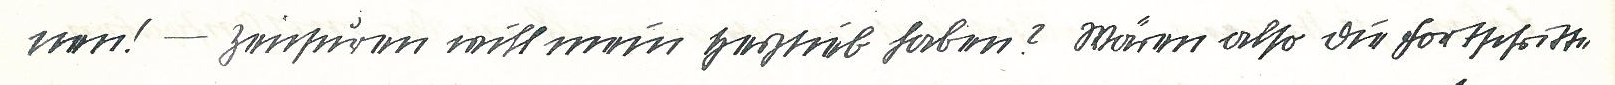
nen! – Zensuren will mein Herzlieb haben? Wären also die Fortschritte
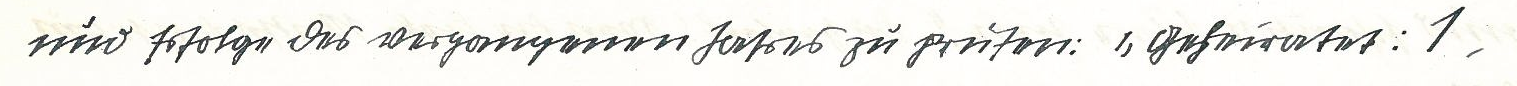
und Erfolge des vergangenen Jahres zu prüfen: 1) Geheiratet: 1,
